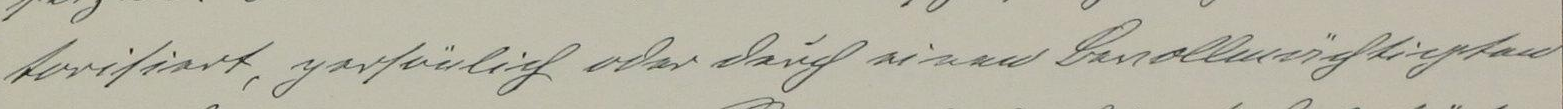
torisiert, persönlich oder durch einen Bevollmächtigten
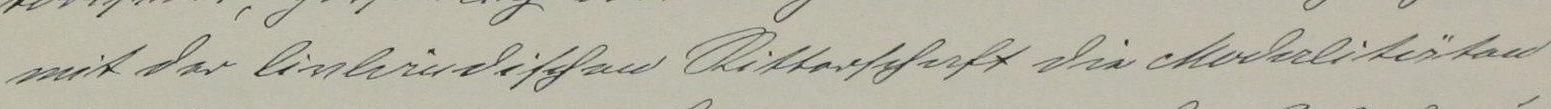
mit der livländischen Ritterschaft die Modalitäten
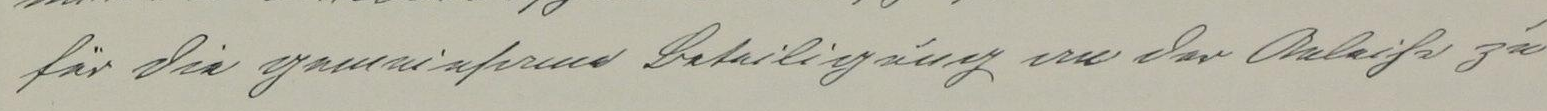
für die gemeinsame Beteiligung an der Anleihe zu
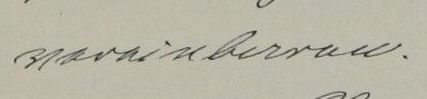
vereinbaren.
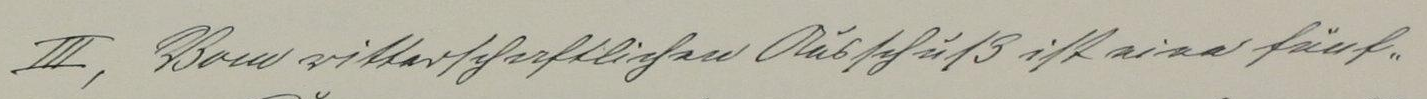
III. Vom ritterschaftlichen Ausschuß ist eine fünf-
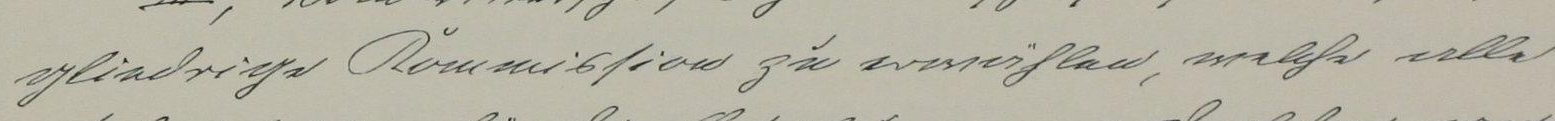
gliedrige Kommission zu erwählen, welche alle
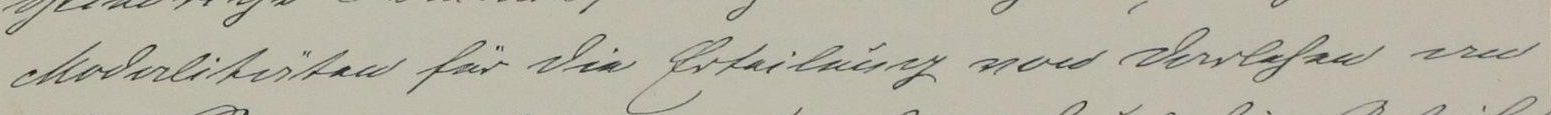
Modalitäten für die Erteilung von Darlehen an
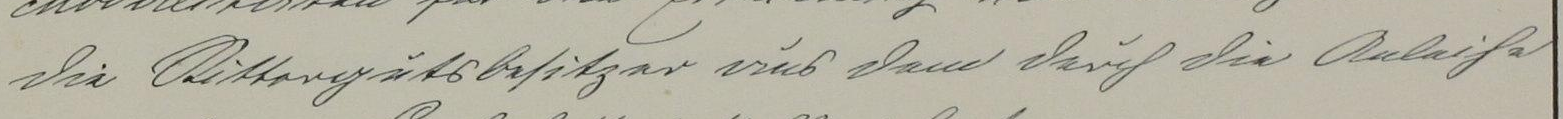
die Rittergutsbesitzer aus dem durch die Anleihe
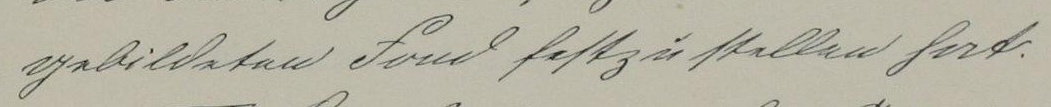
gebildeten Fond festzustellen hat.
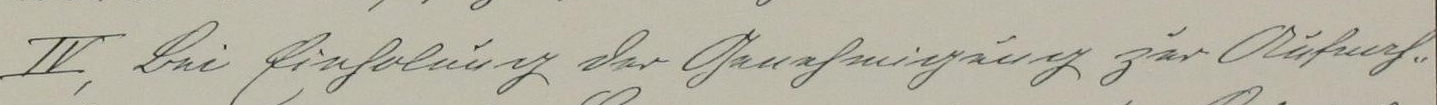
IV. Bei Einholung der Genehmigung zur Aufnah-
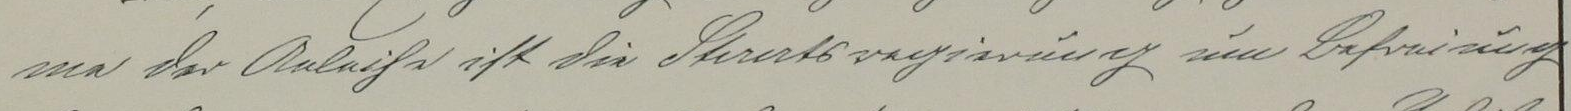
me der Anleihe ist die Staatsregierung um Befreiung
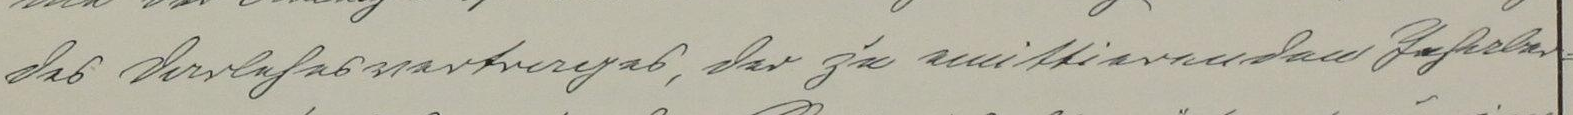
des Darlehnsvertrages, der zu emittierenden Inhaber-
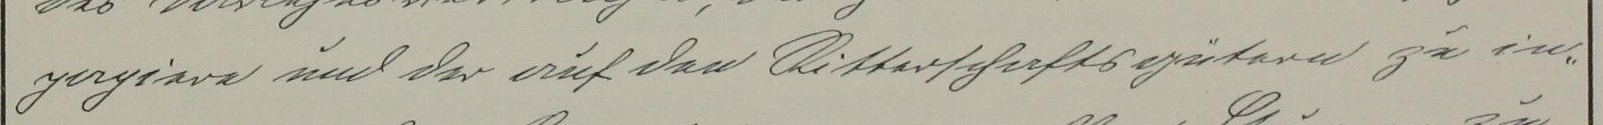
papiere und der auf den Ritterschaftsgütern zu in-
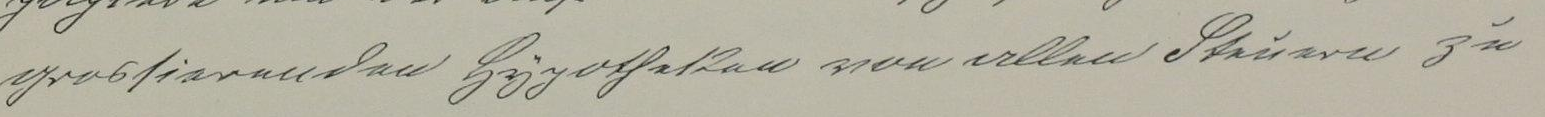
grossierenden Hypotheken von allen Steuern zu
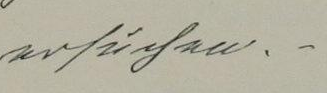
ersuchen.
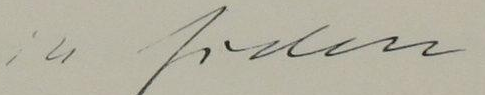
in fidem
